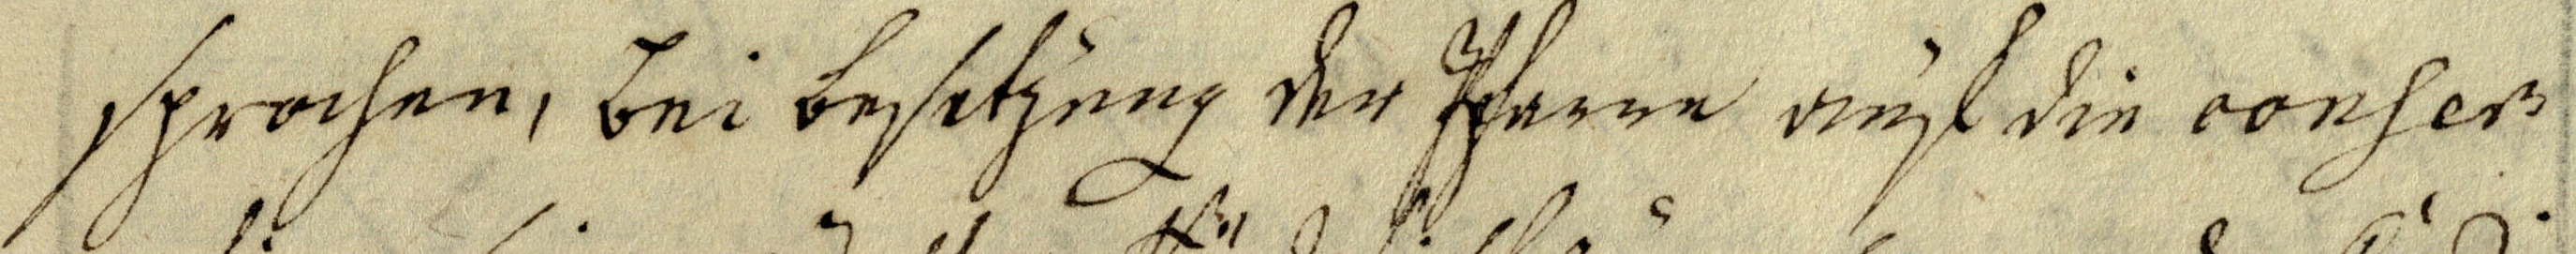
sprochen, bei Besetzung der Pfarre auf die conser¬
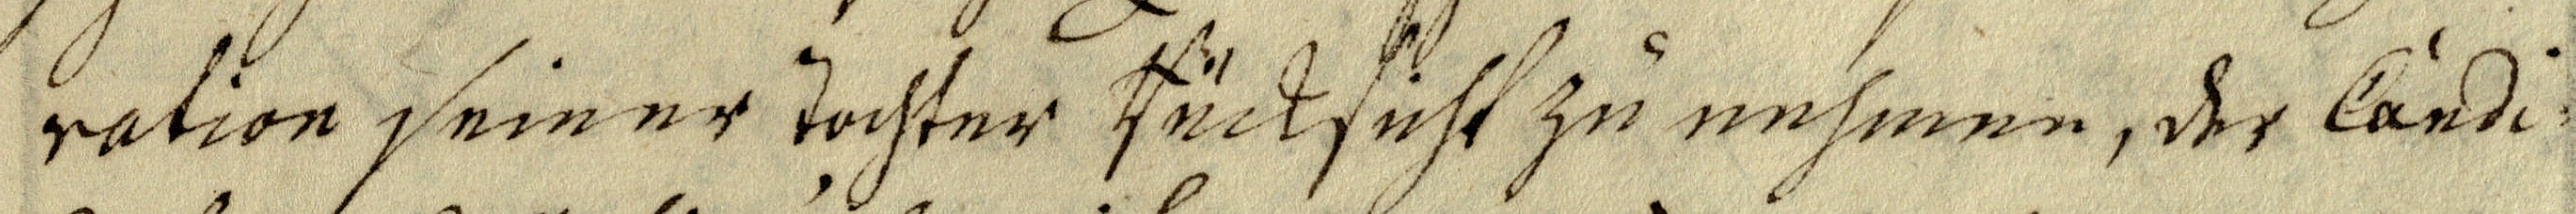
vation seiner Tochter Rücksicht zu nehmen, der Candi¬
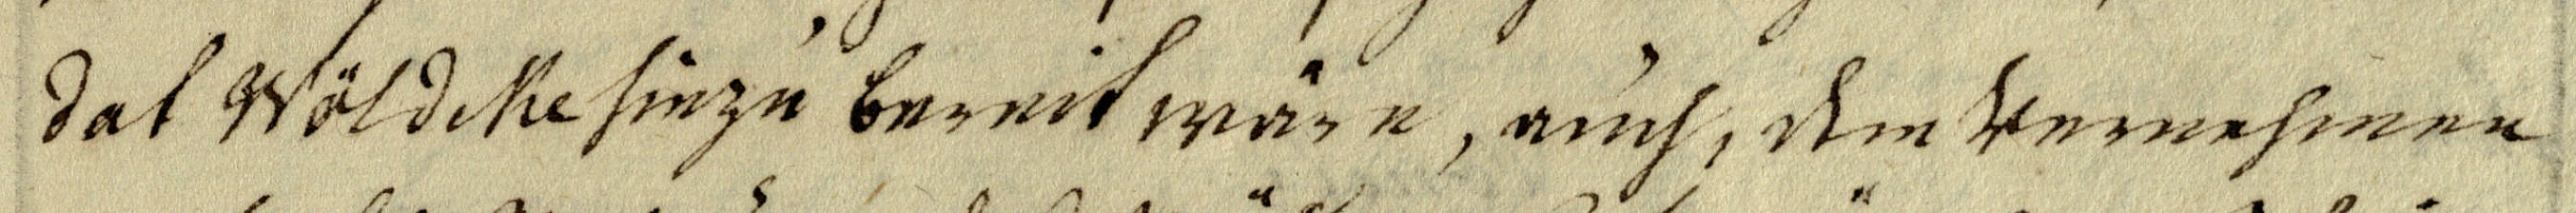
dat Wöldecke hiezu bereit wäre, auch, dem Vernehmen
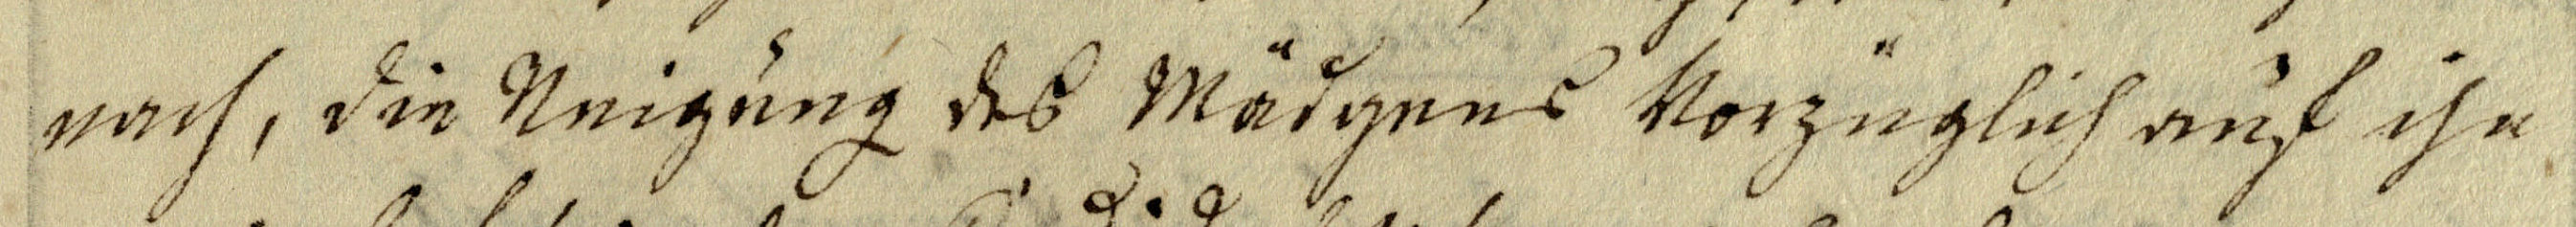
nach, die Neigung des Mädgens vorzüglich auf ihn
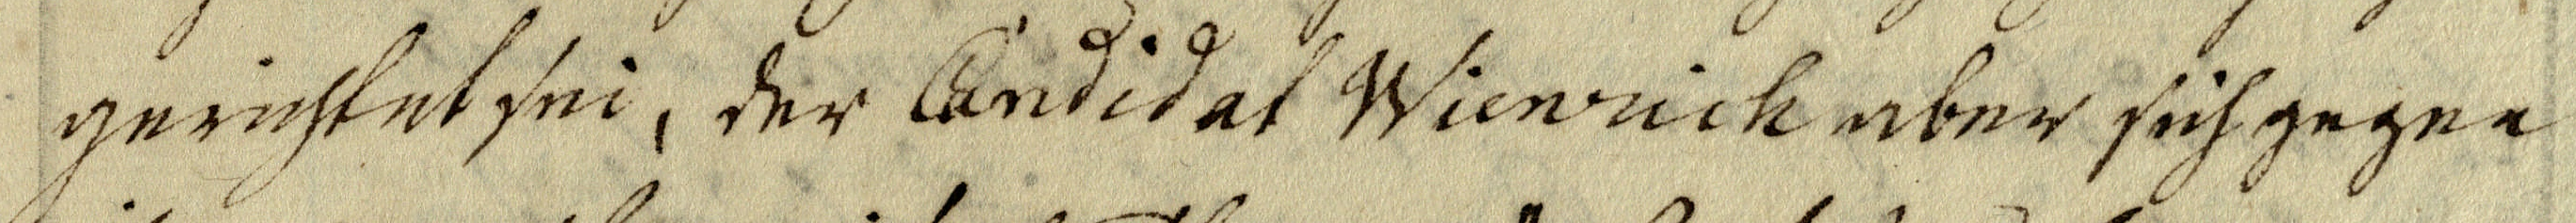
gerichtet sei, der Candidat Wienrich aber sich gegen
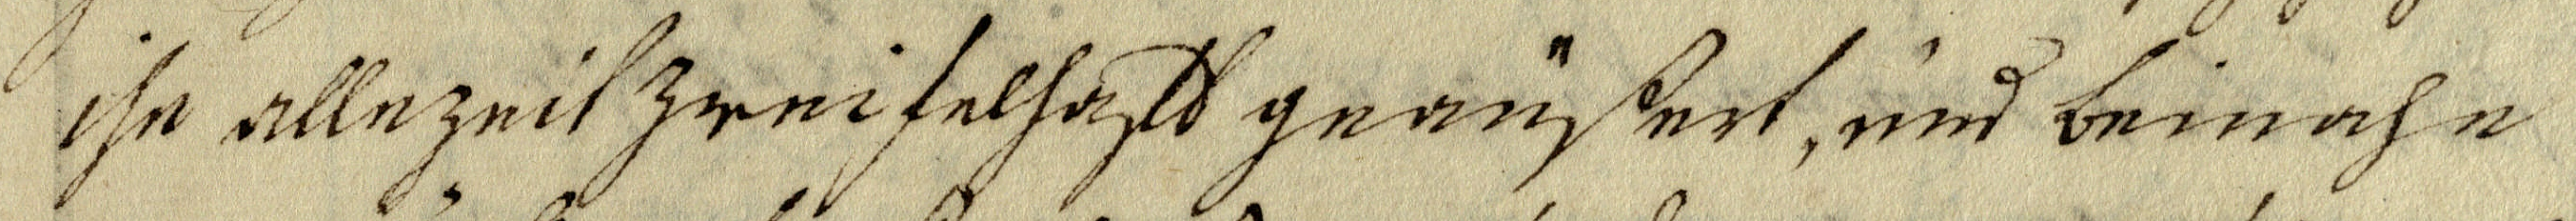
ihn allezeit zweifelhaft geäußert, und beinahe
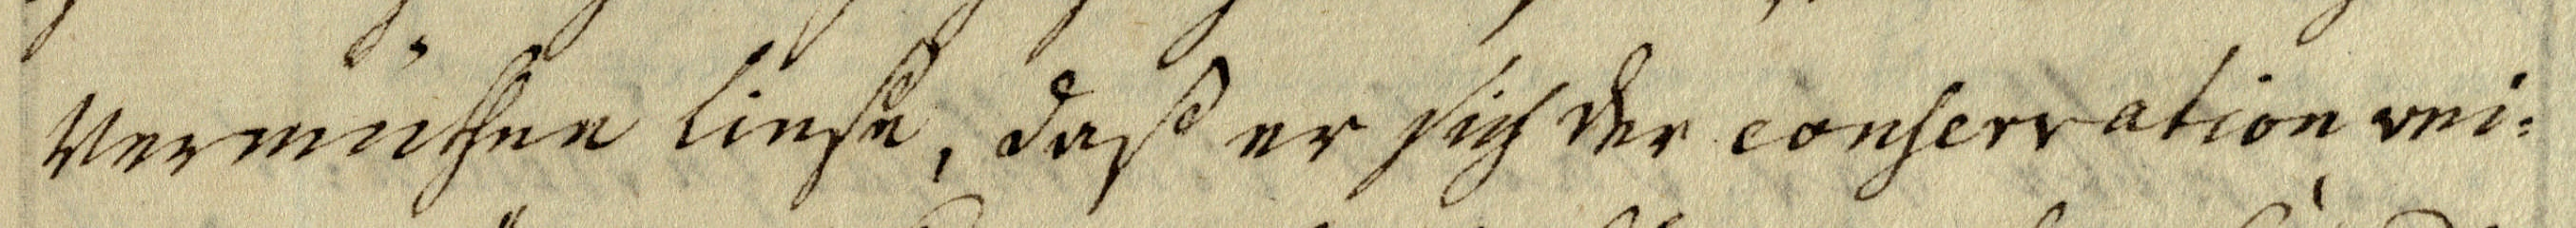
vermuthen ließe, daß er sich der conservation wei¬
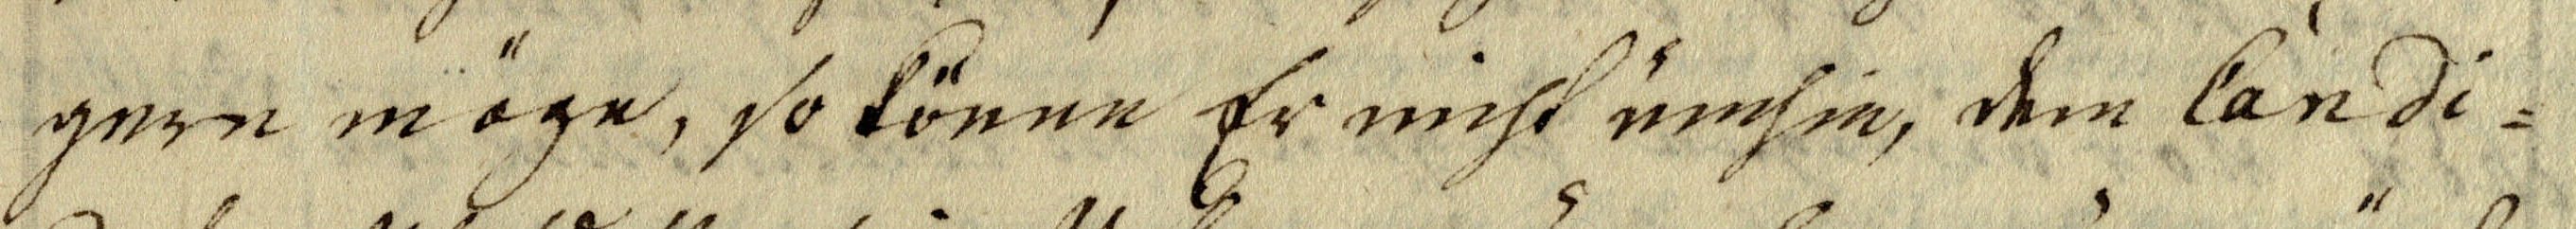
gern möge, so könne Er nicht umhin, dem Candi¬
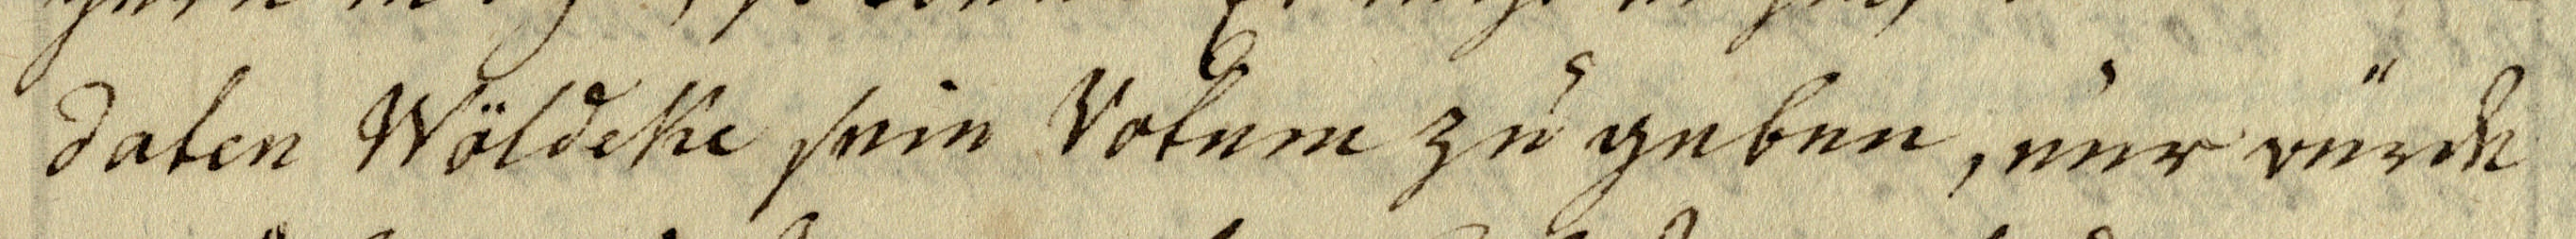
daten Wöldeke sein Votum zu geben, nur würde
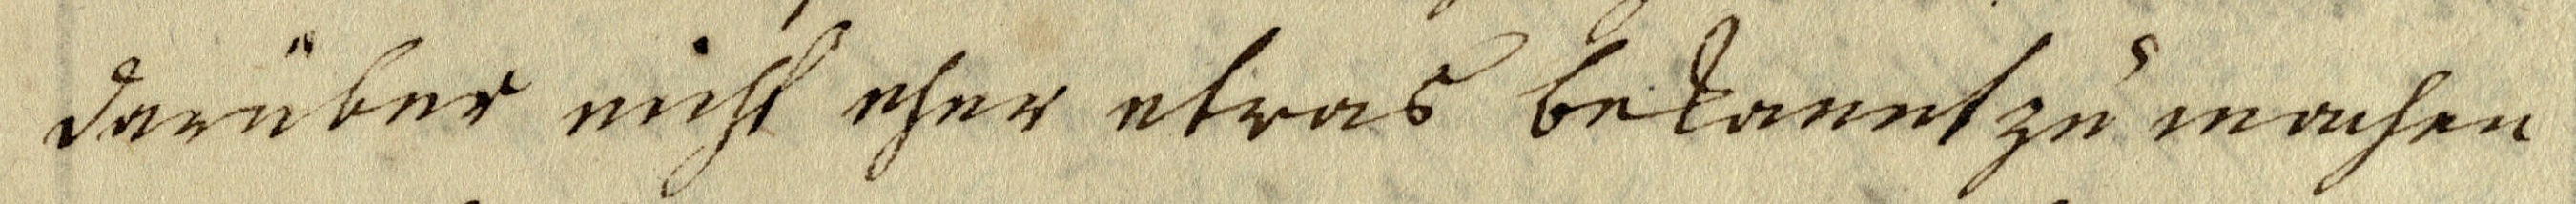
darüber nicht eher etwas bekannt zumachen
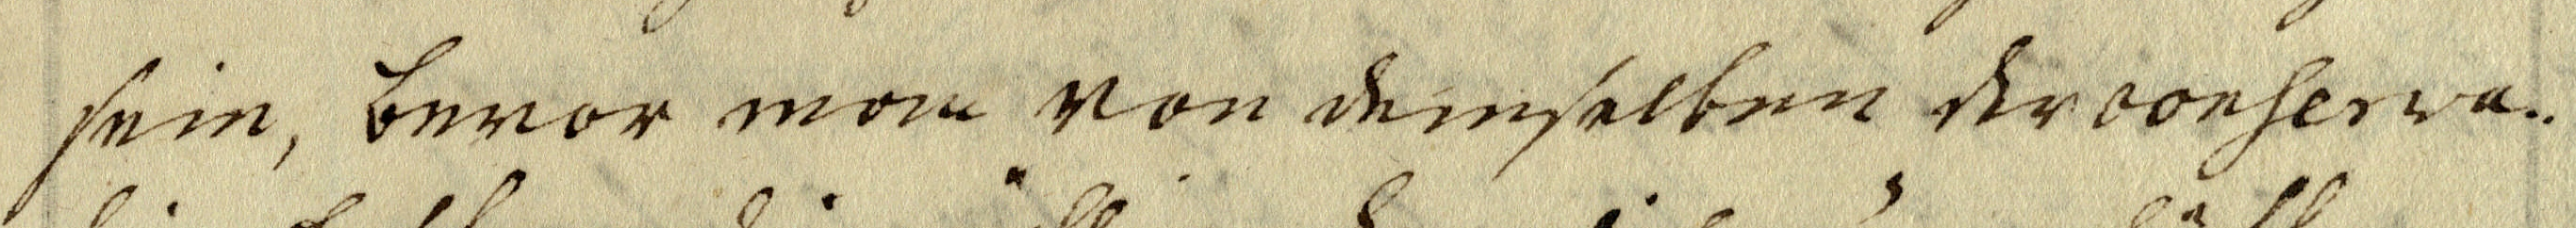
sein, bevor man von demselben der conserva¬
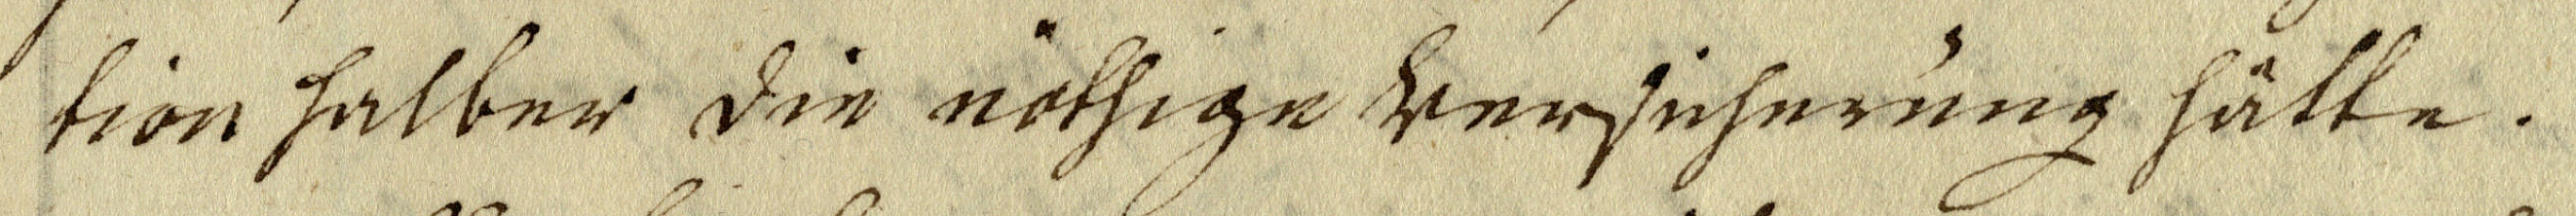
tion halber die nöthige Versicherung hätte.
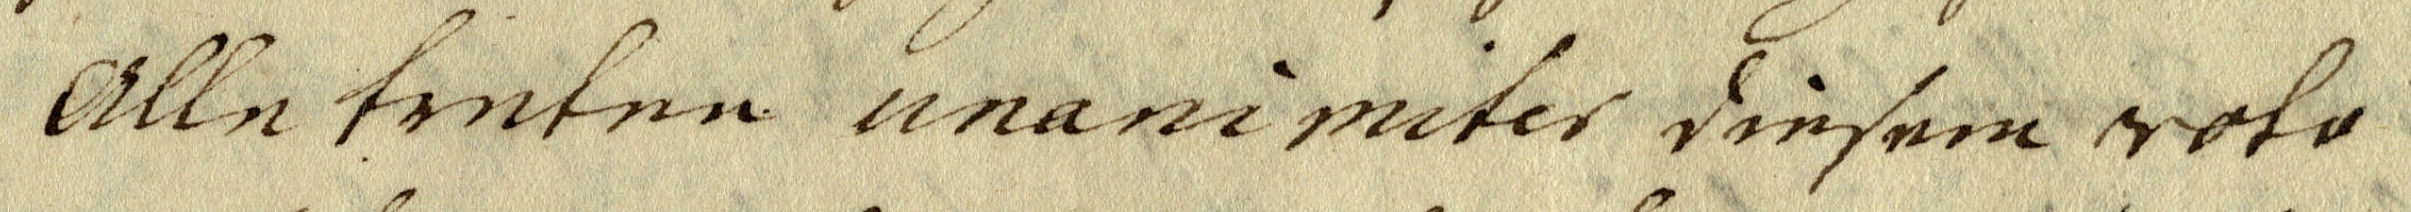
Alle treten unanimiter diesem voto
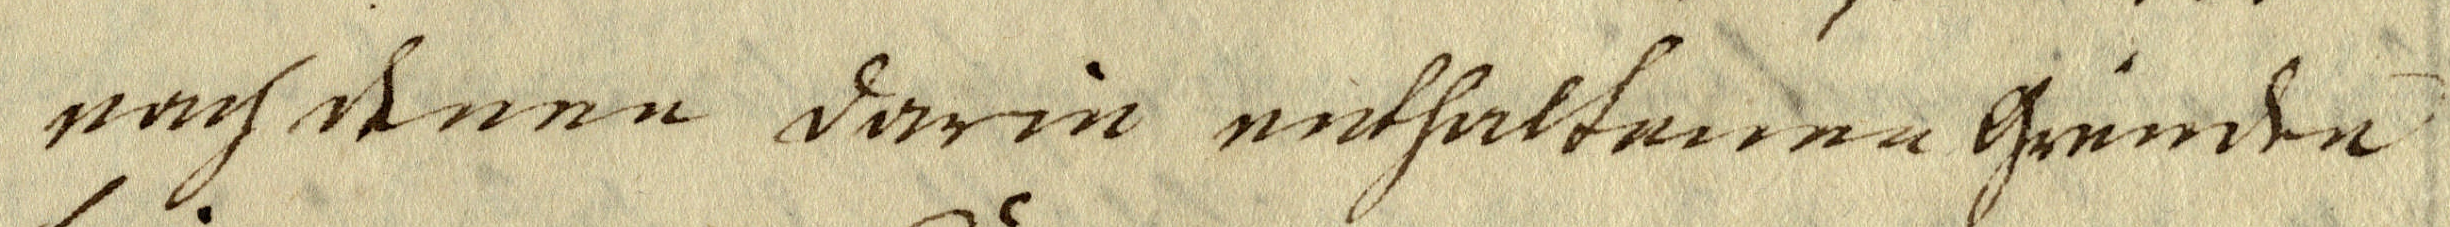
nach denen darin enthaltenen Gründen
